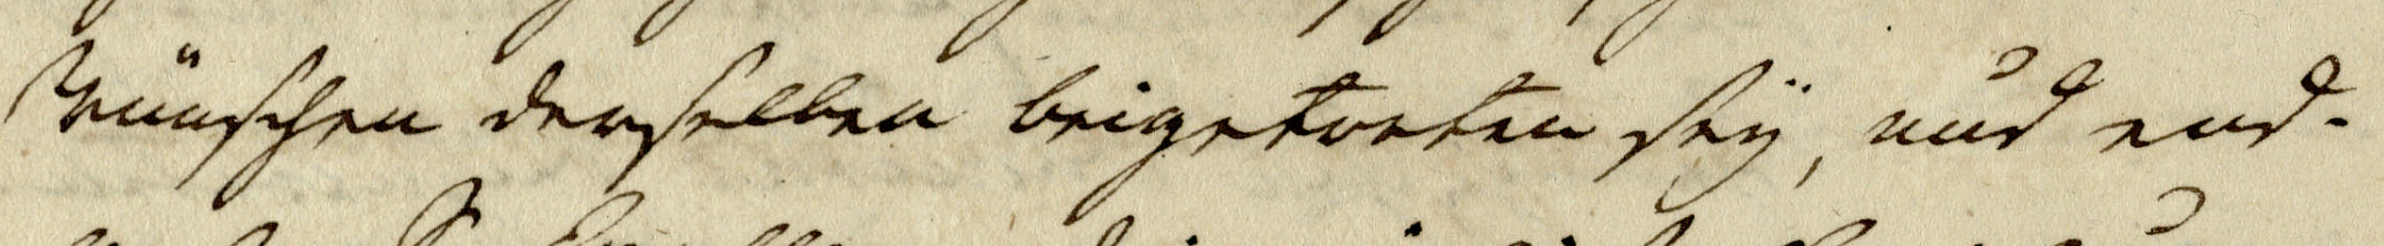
Wünschen derselben beigetreten seÿ, und end¬
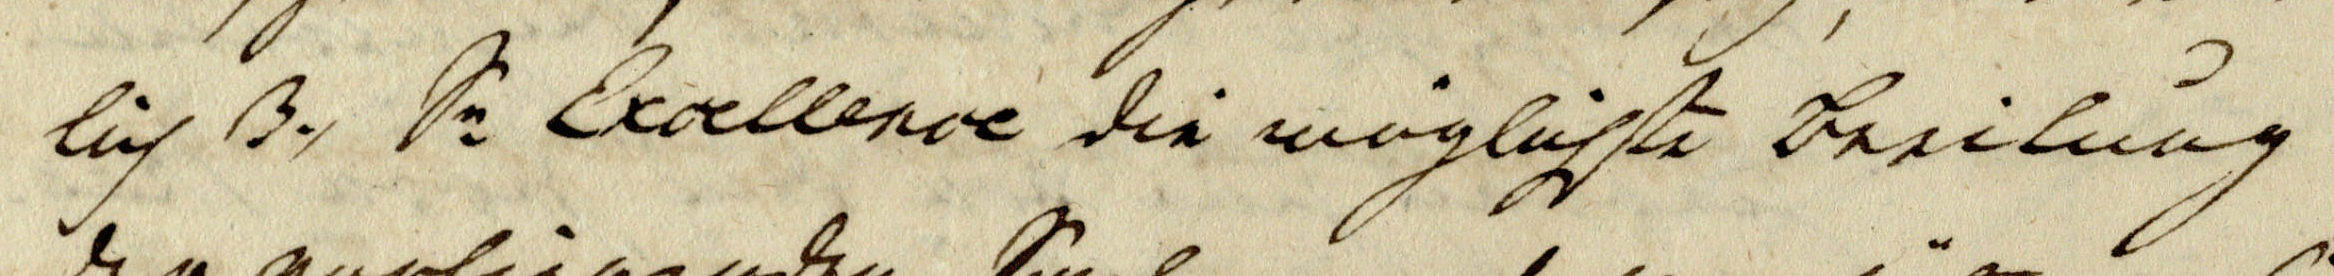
lich 3., Sr Excellence die möglichste Beeilung
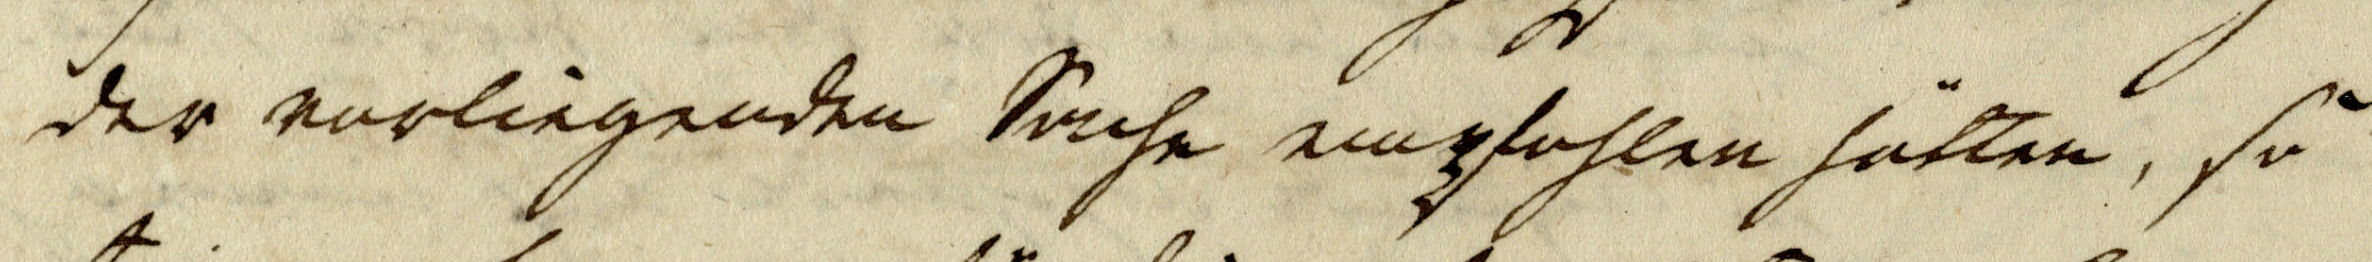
der vorliegenden Sache empfohlen hätten, so
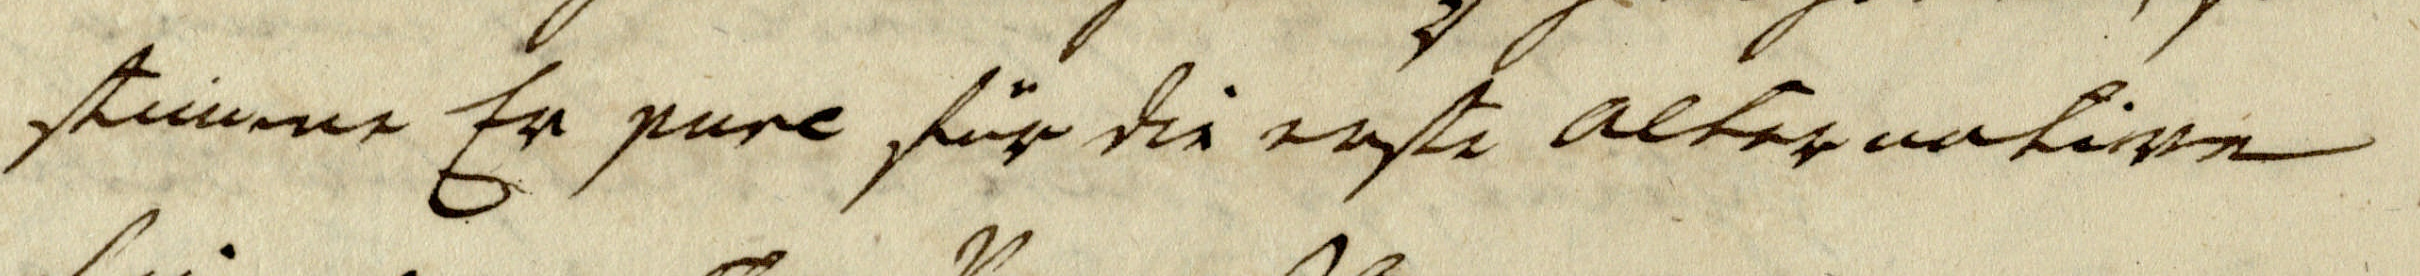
stimme Er pure für die erste Alternatie
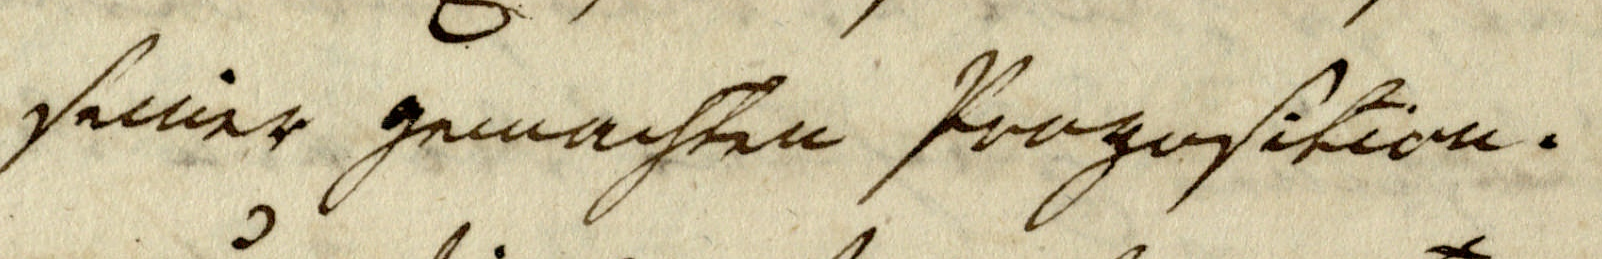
seiner gemachten Proposition.
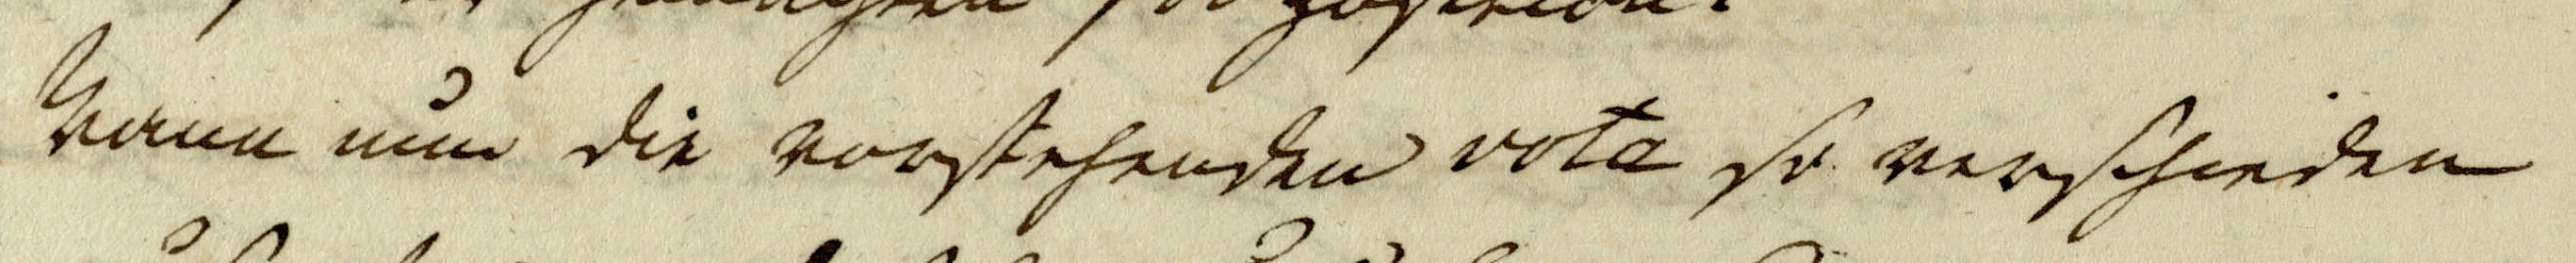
Wann nun die vorstehenden vota so verschieden
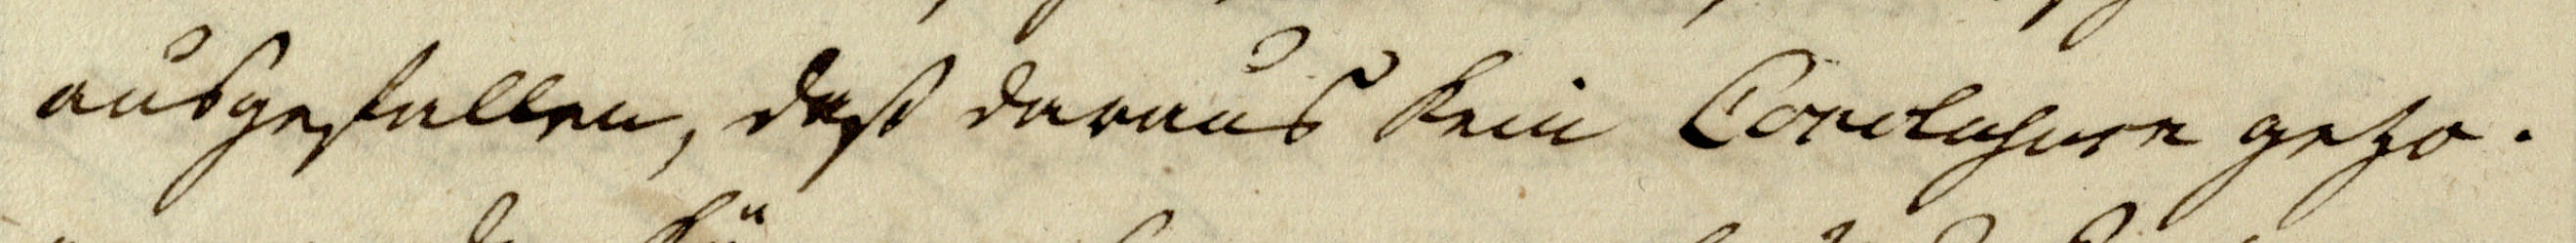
ausgefallen, daß daraus kein Conclusum gezo¬
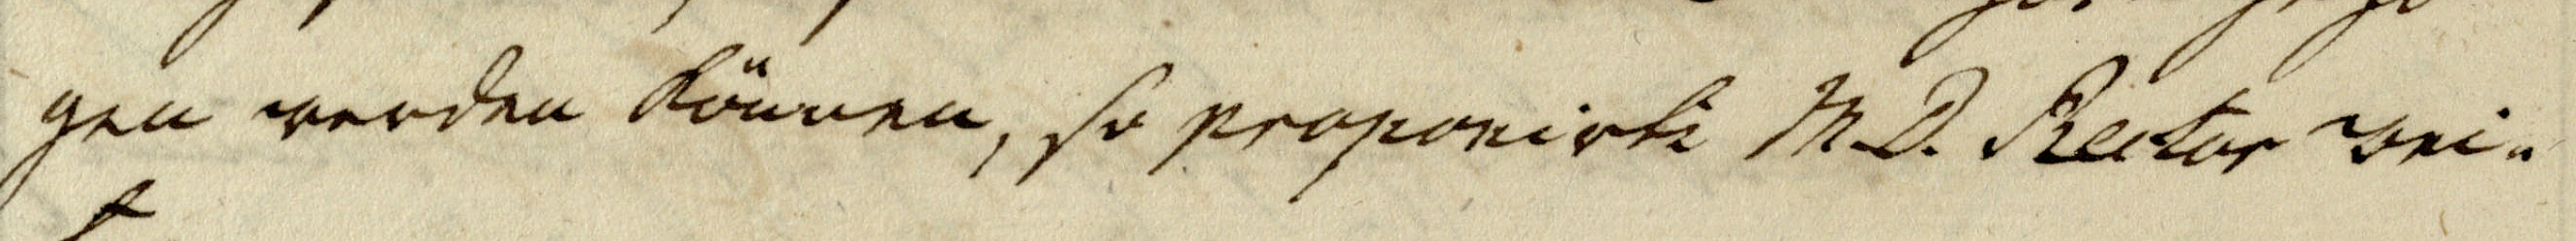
gen werden können, so proponirte M. D Rector wei¬
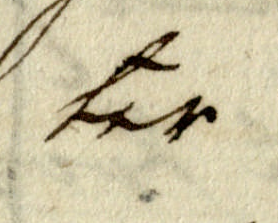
ter
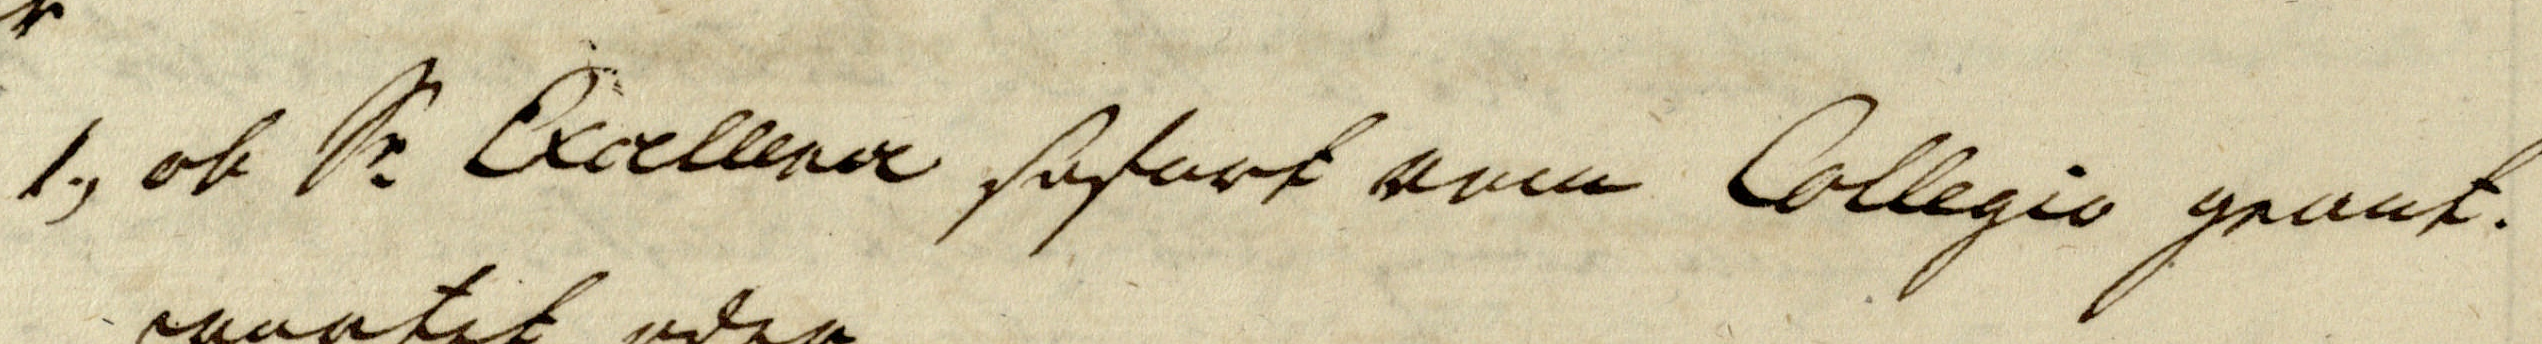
1., ob Sr Excellence sofort vom Collegio geant¬
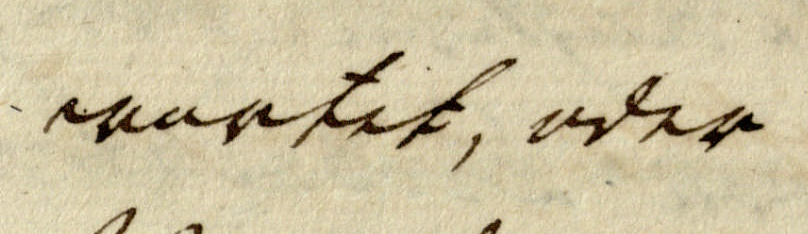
wortet, oder
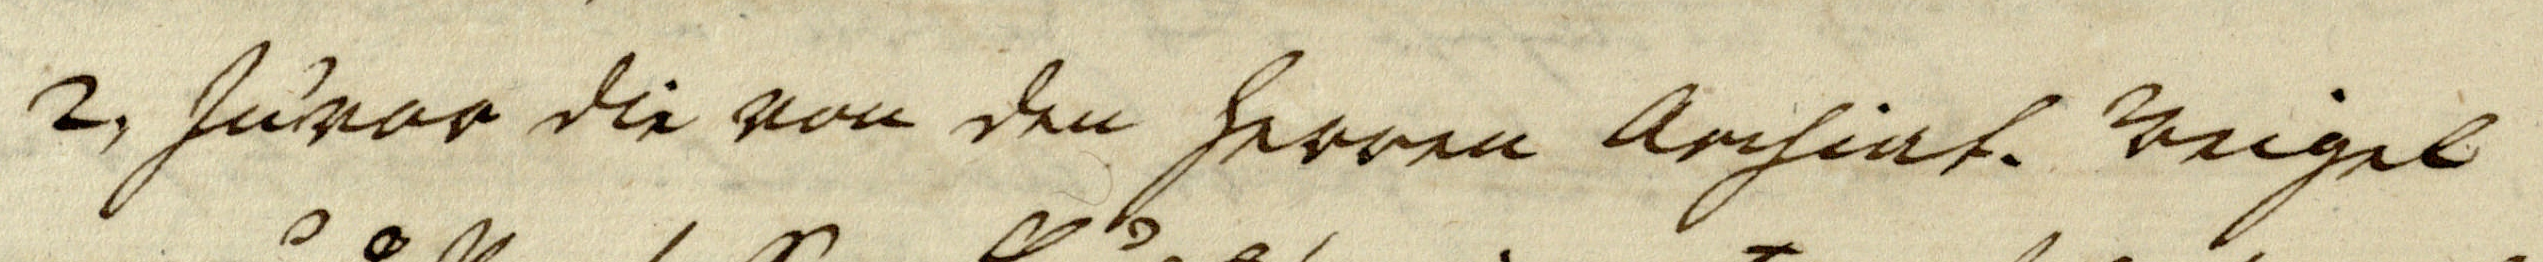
2, zuvor die von den Herren Archiat. Weigel
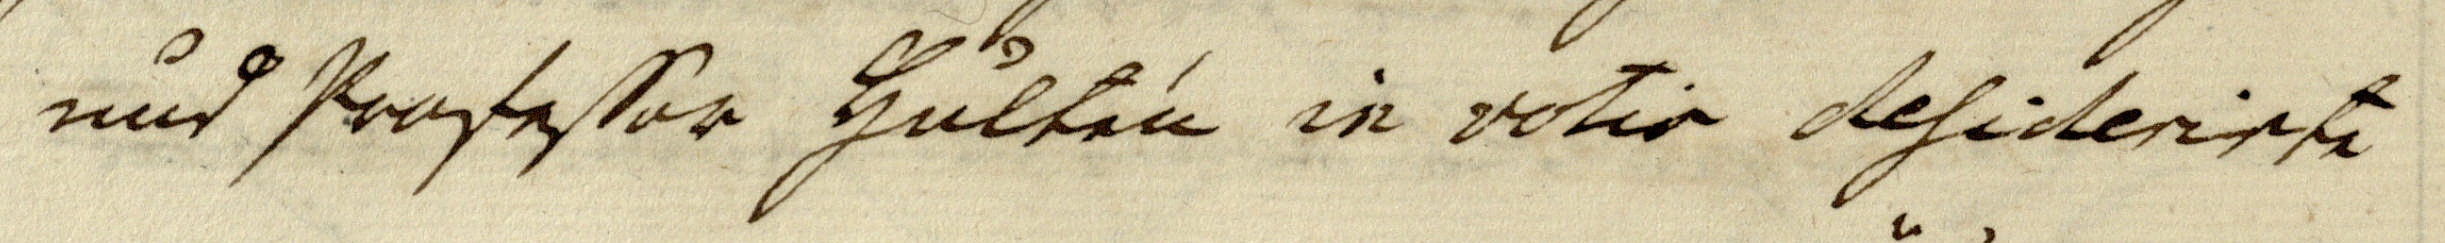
und Professor Hultén in votis desiderirte
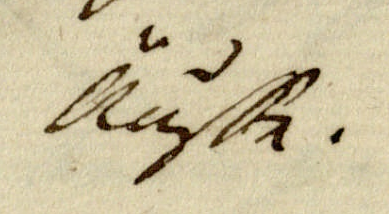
Äusse¬
